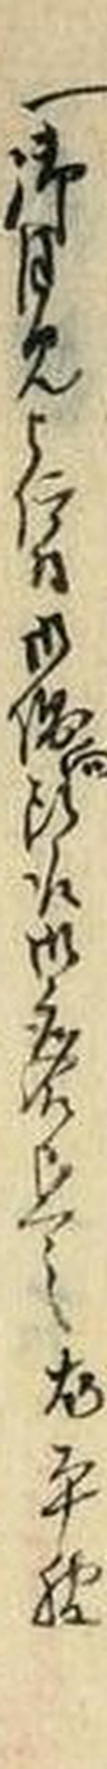御目見被仰付御側向頭取御取合申上之尤平服
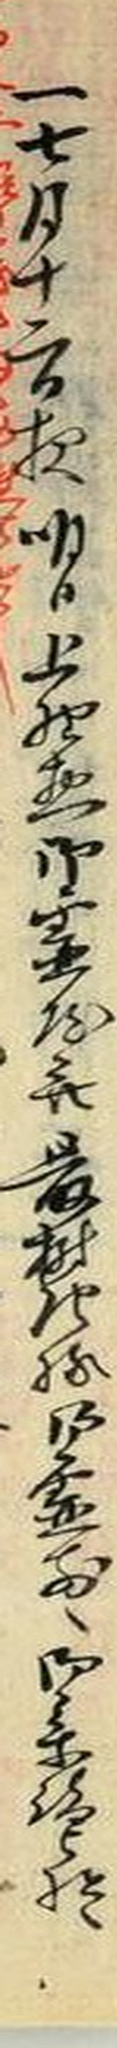一七月十二日夜明日上野惣御霊屋并最樹院様御霊前へ御参詣被遊候
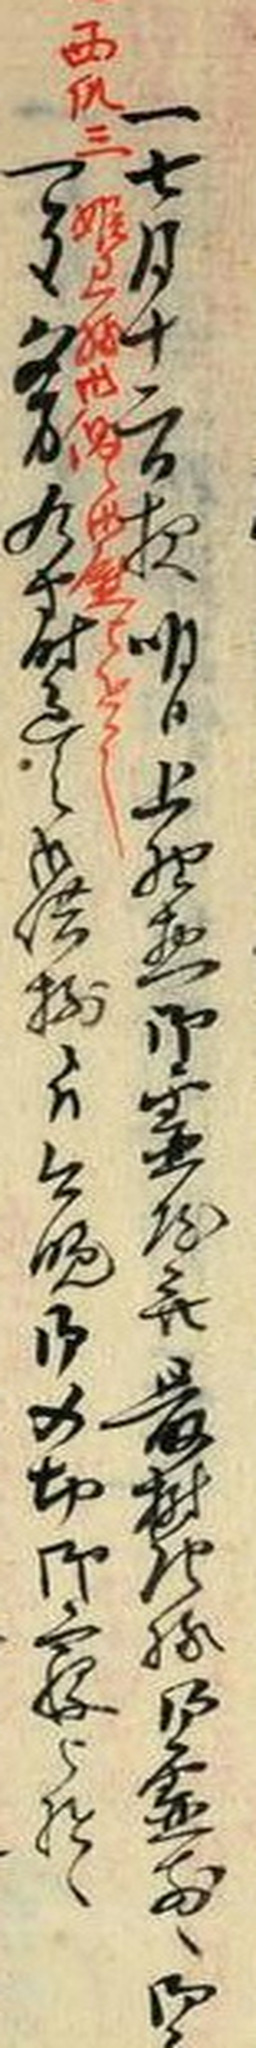へとも夕方九半時過之御供揃ニ付今晩御〆切御寝被遊候
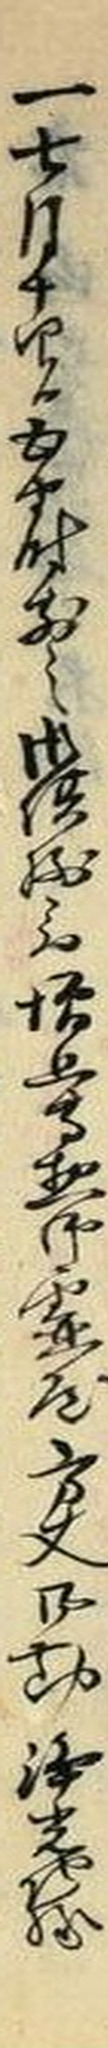一七月十四日五半時前之御供揃ニ而増上寺惣御霊屋方丈御勤浄光院様
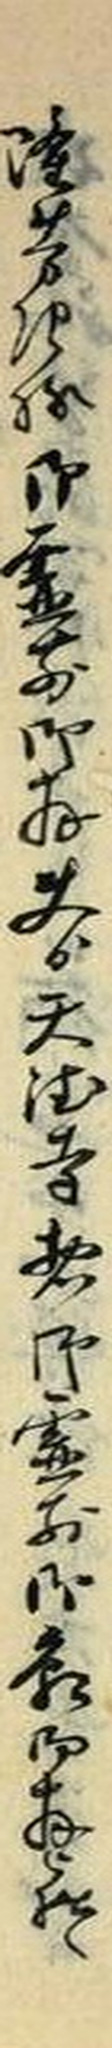隆芳院様御霊前御拝夫ゟ天徳寺惣御霊前於御廟御拝被遊候
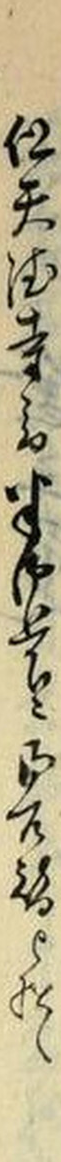但天徳寺ニ而半御上下ニ御召替被遊候
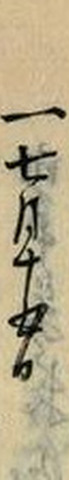一七月十五日
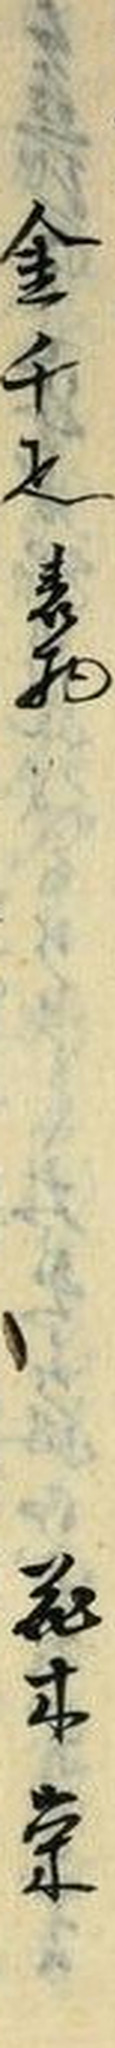金千疋表物花木栄
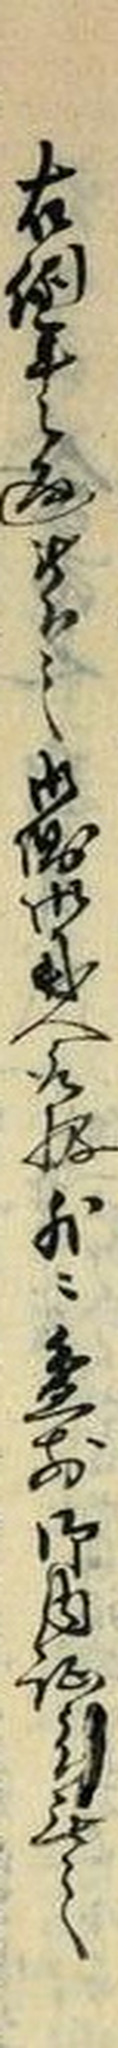右例年之通被下之御側御用人取扱外ニ盆前御内証被下無之
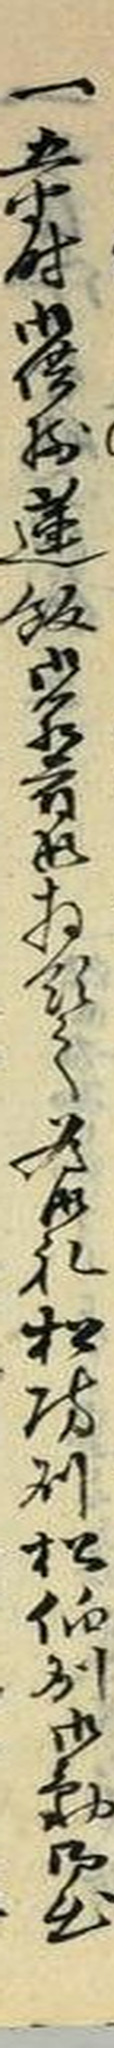一五半時御供揃蓮飯御箱肴御拝領之為御礼松防州松伯州御勤御出
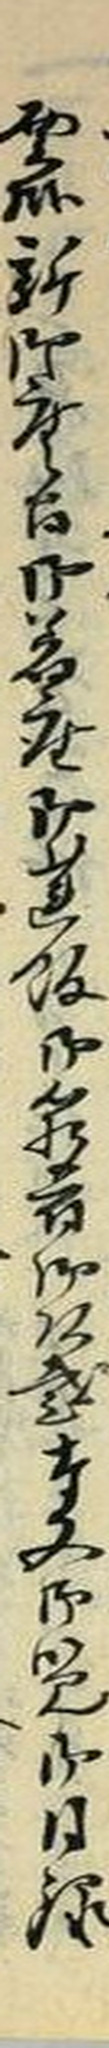殿掛新御座之間御着座御蓮飯御箱肴御頂戴奉文御覧御目録
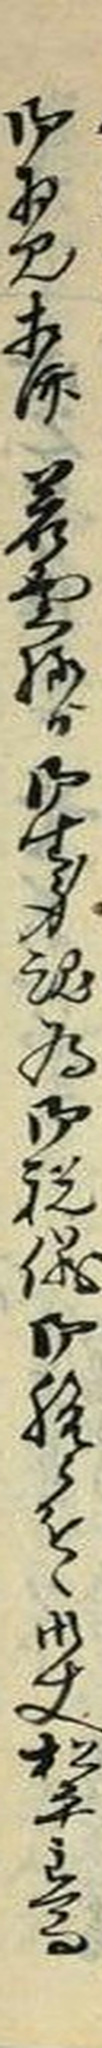御拝見相済若殿様ゟ御生身魂為御祝儀御膳被進候御使松平主馬
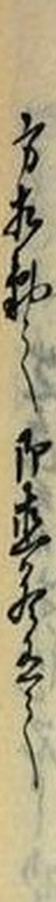方相勤之御直答有之
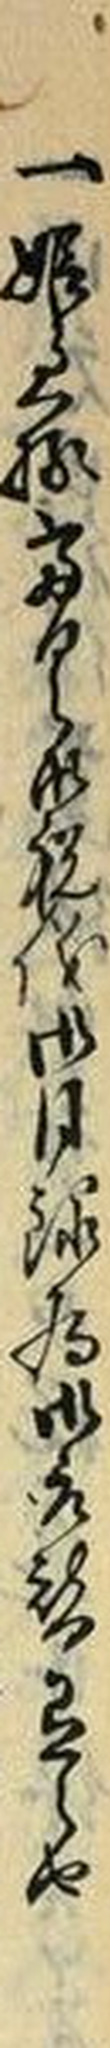一姫君様当日之御祝儀御目録為御取替有之由
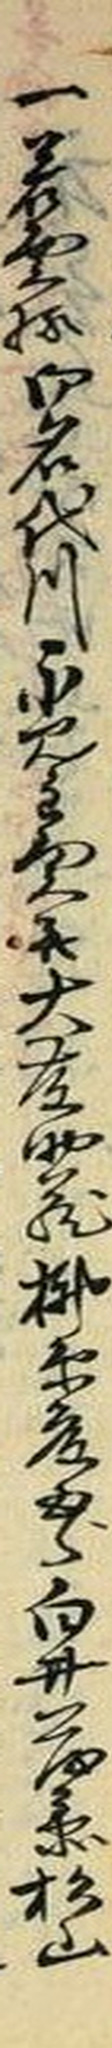一若殿様御名代川永見主殿并大藤助蔵榊原藤五郎白井藤兵衛杉山
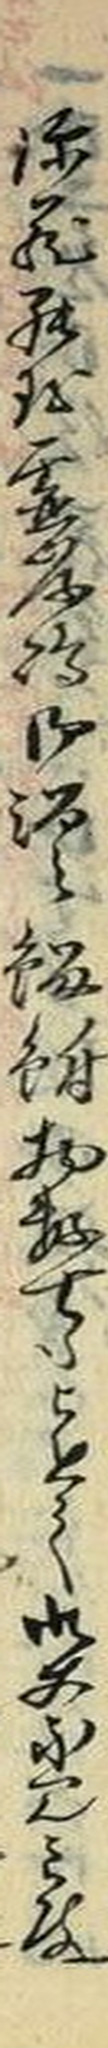源蔵罷越霊岸嶋御溜之鰡鮒物数十ツヽ被進之御使永見主殿
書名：少傅日録抄（斉承付側向頭取日記、在府）
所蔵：福井県文書館 Fukui Prefectural Archives
